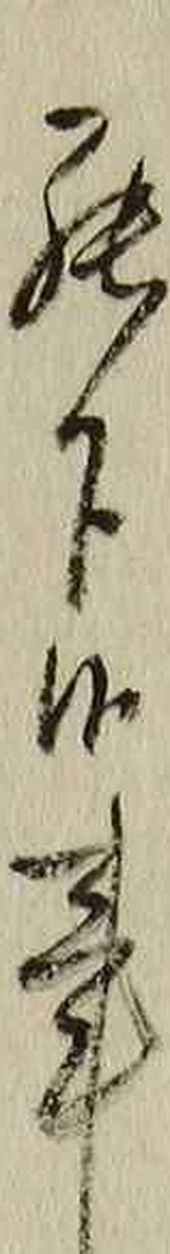罷下候事
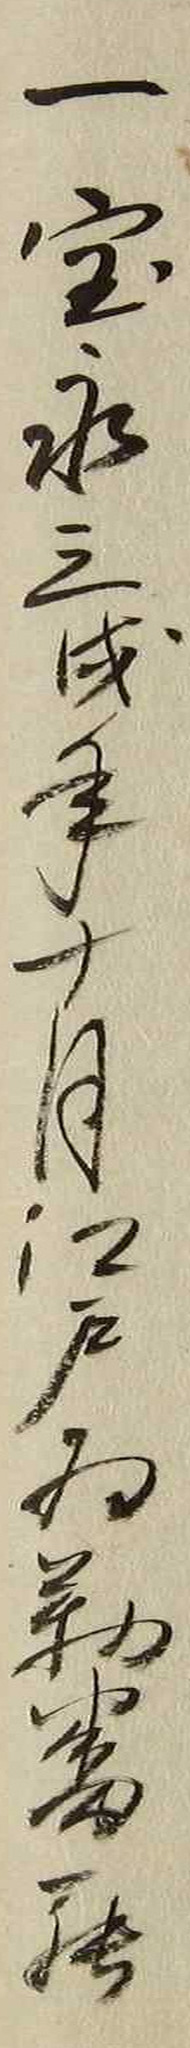一宝永三戌年十月江戸為勤番罷
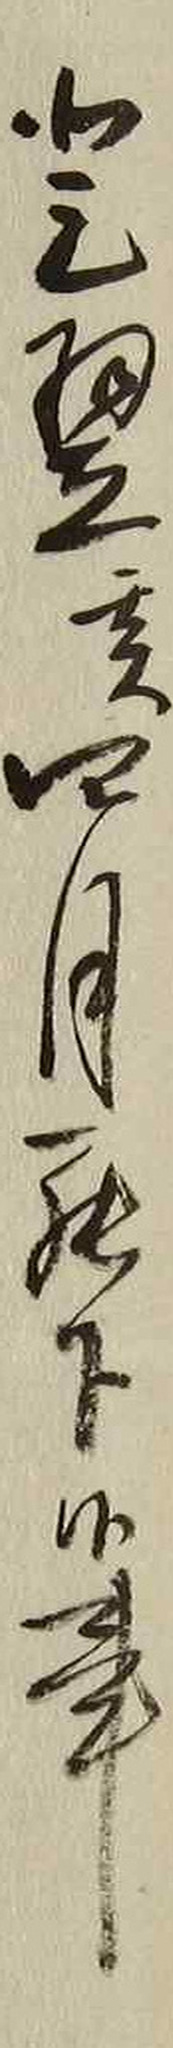登翌亥四月罷下候事
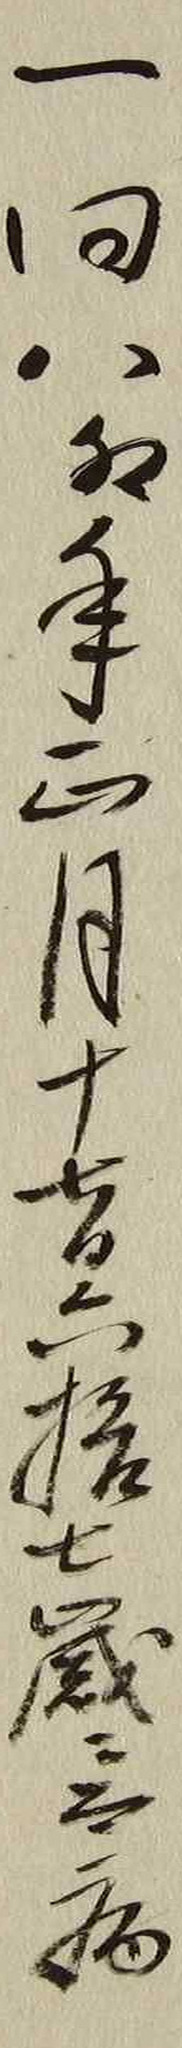一同八卯年正月十七日六拾七歳ニ而病
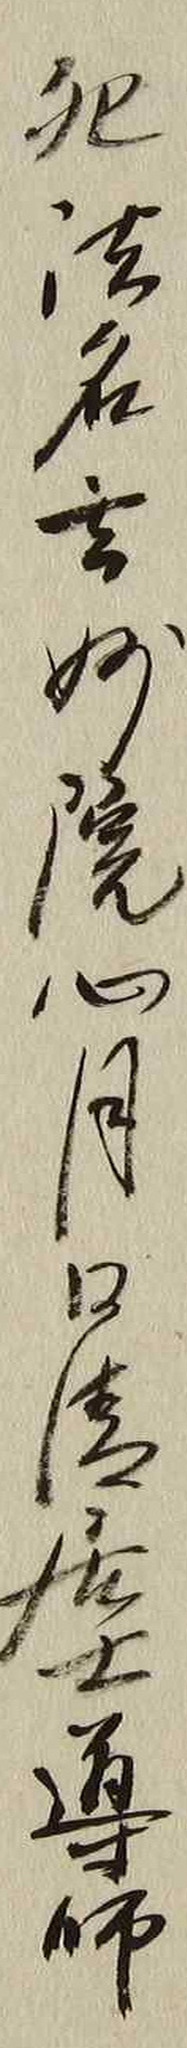死法名玄妙院心月日清居士導師
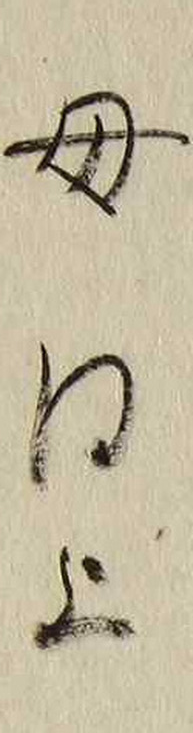母同上
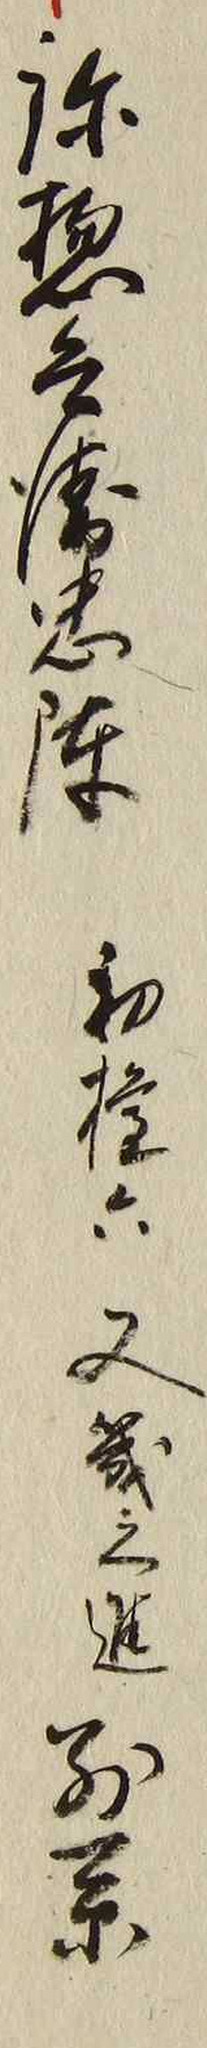弥惣兵衛忠陣初権六又筬之進別系

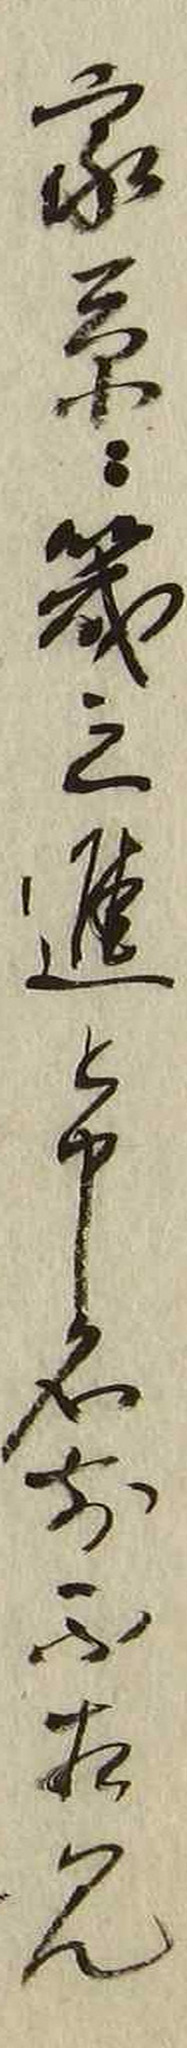家系ニ筬之進と申名前不相見
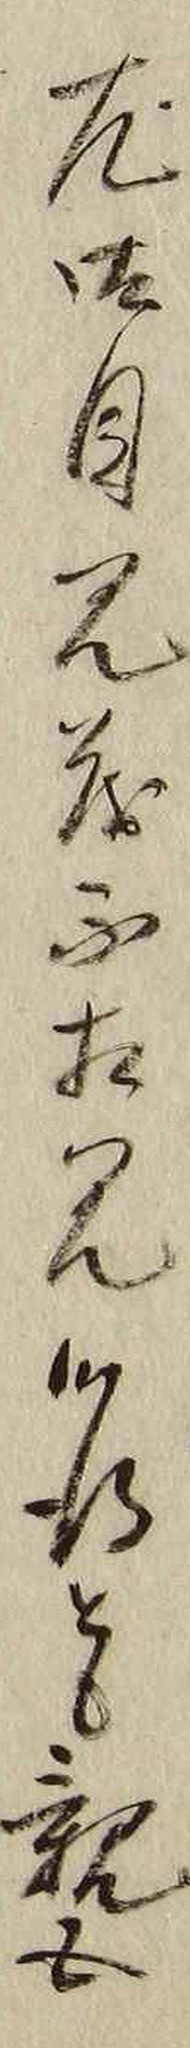尤御目見茂不相見候得とも親五
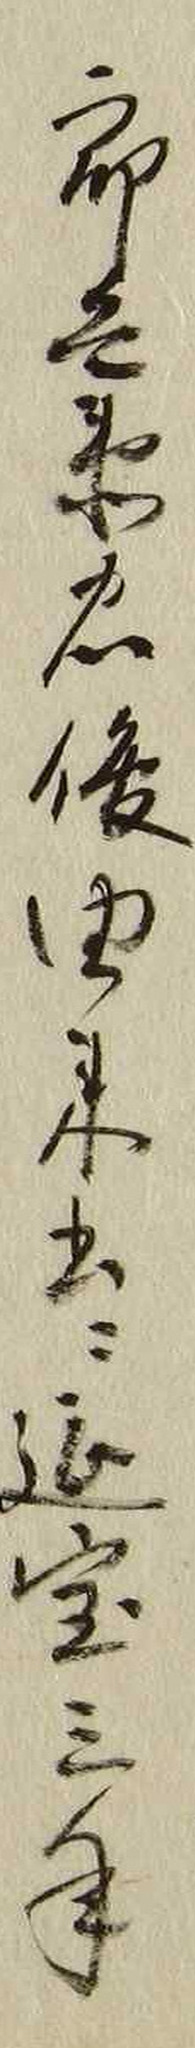郎兵衛忠俊由来書ニ延宝三年
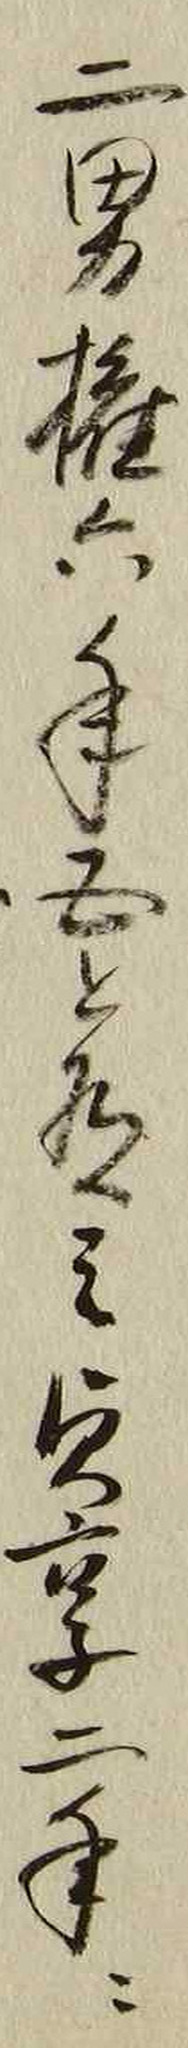二男権六年五と有之貞享二年ニ
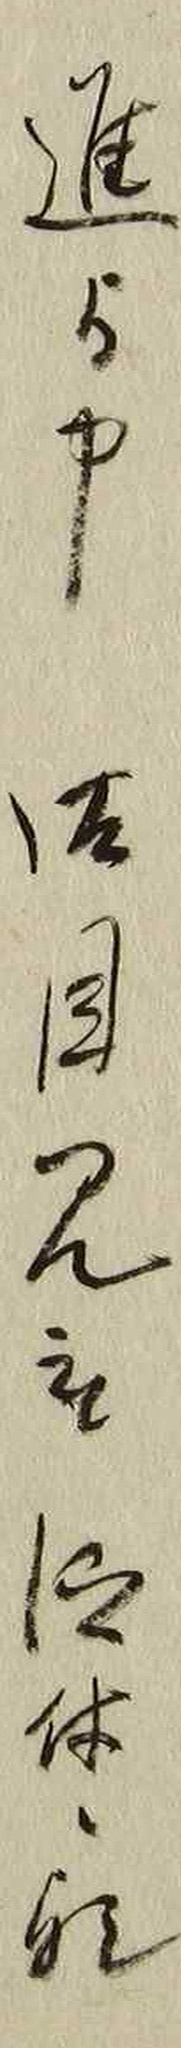進与申御目見被仰付候か
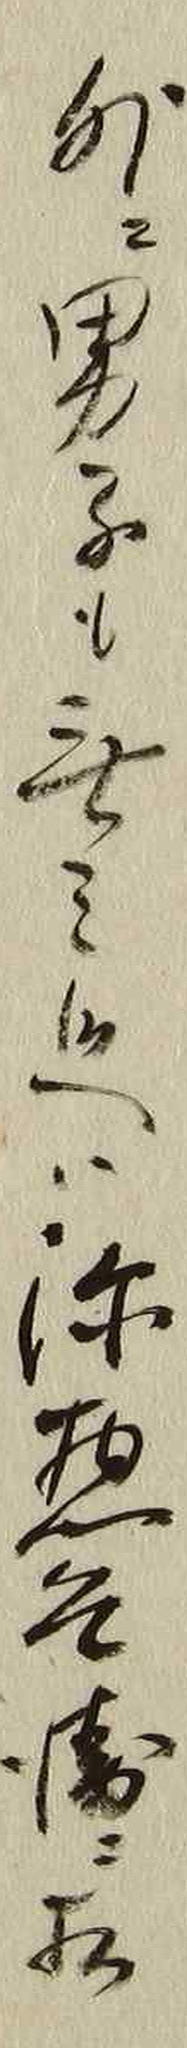外ニ男子も無之候へハ弥惣兵衛ニ相
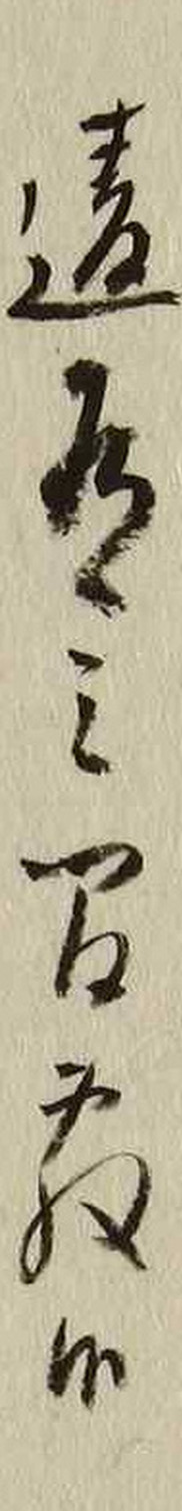違有之間敷候
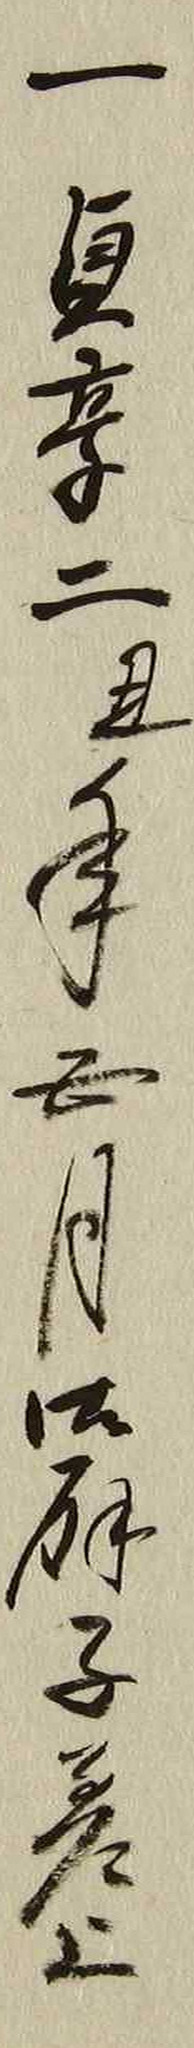一貞享二丑年五月御扇子差上
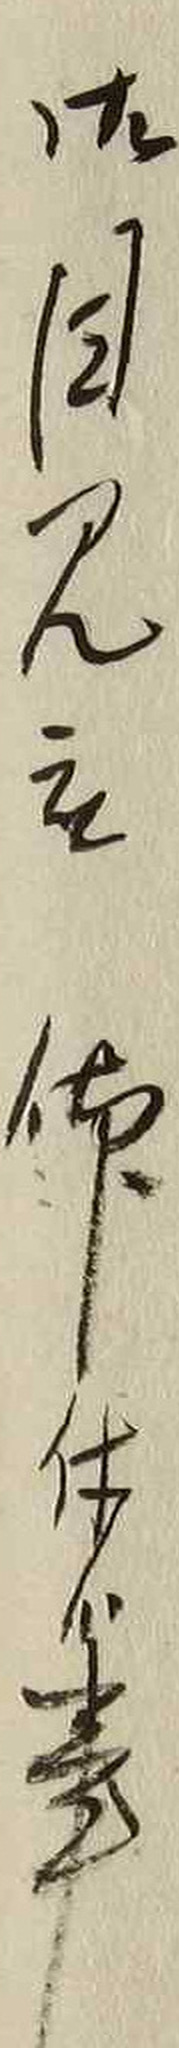御目見被仰付候事
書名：諸士系譜　巻之351　す之部1
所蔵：会津若松市立会津図書館
